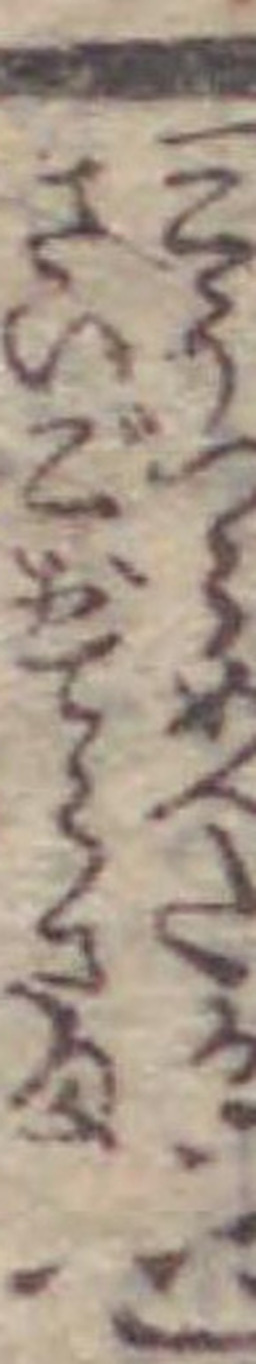さいごおてらさま
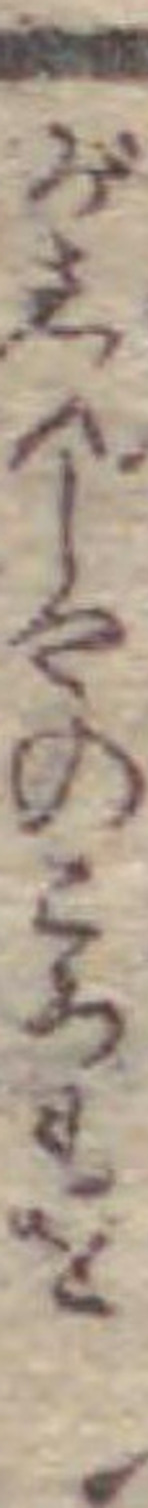がしやしけのころもを
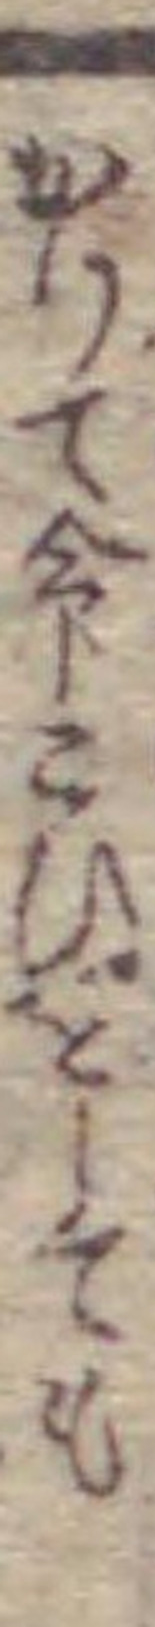かりて命こひをしても
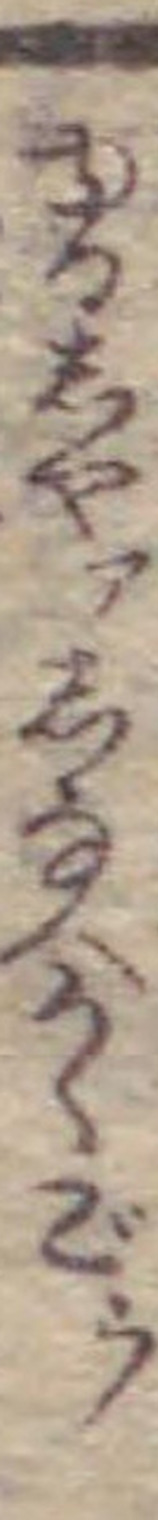ゆるしゃアしなへかくごゥ
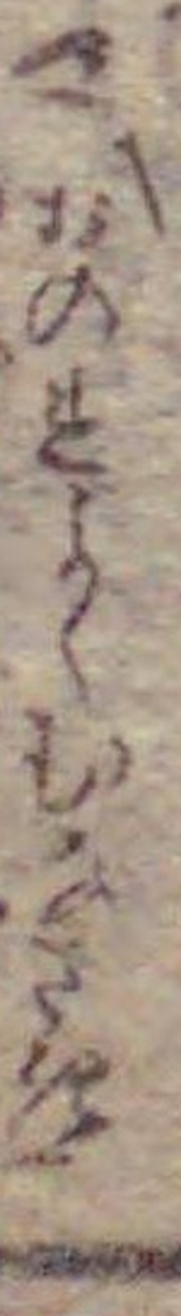〽おのれよくむなさき
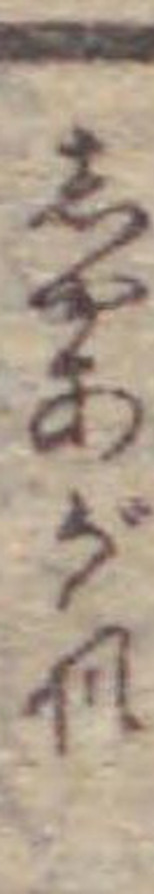しやあがれ
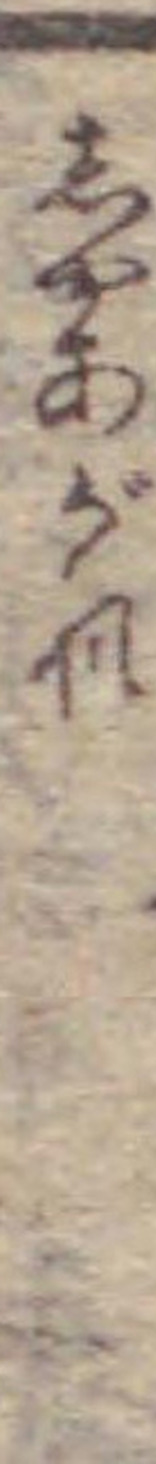しやあがれ

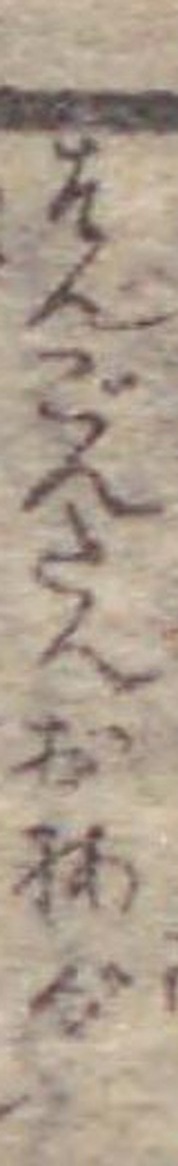はんごんたんお梅が
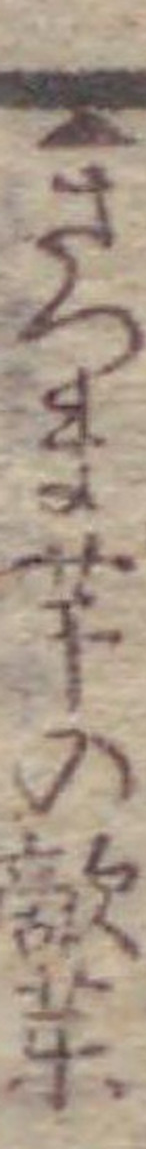▲さつま芋の敵薬
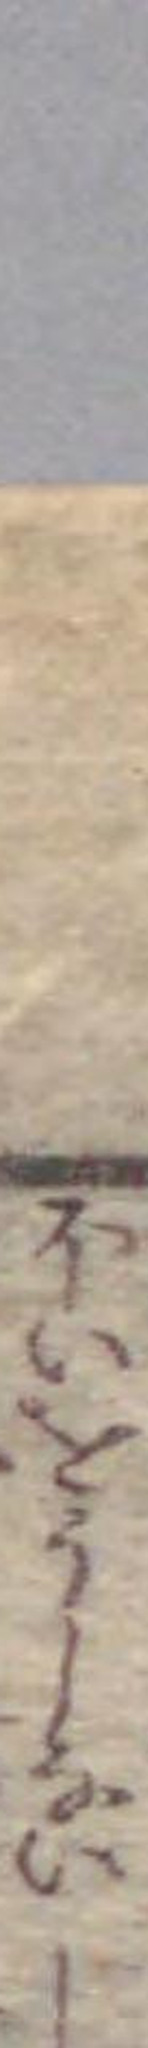ほいをうしない
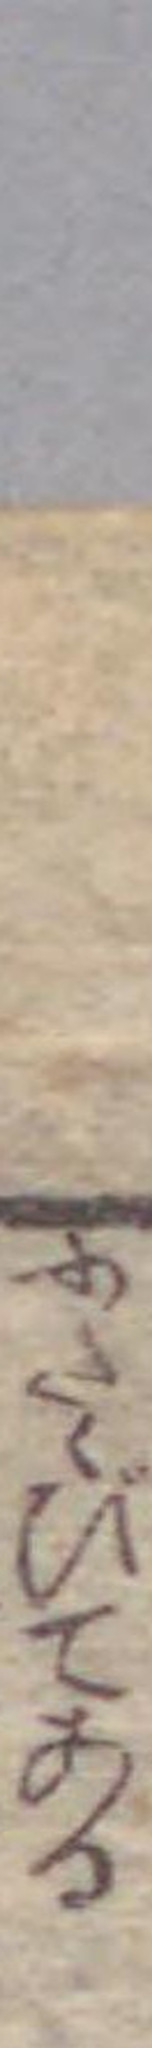ふたゝびてある
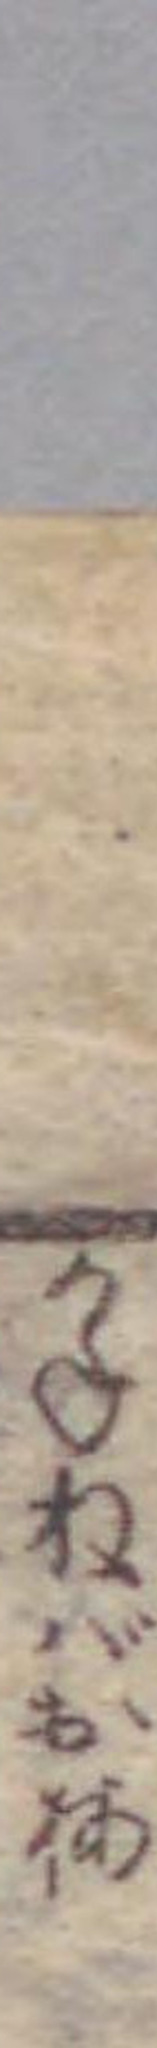かねばお梅
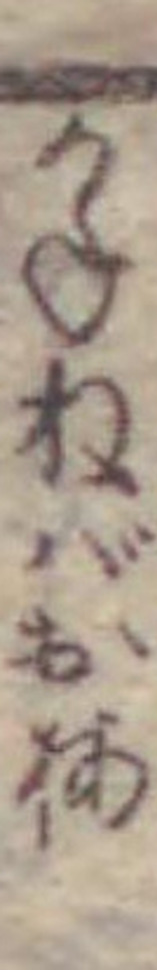かねばお梅
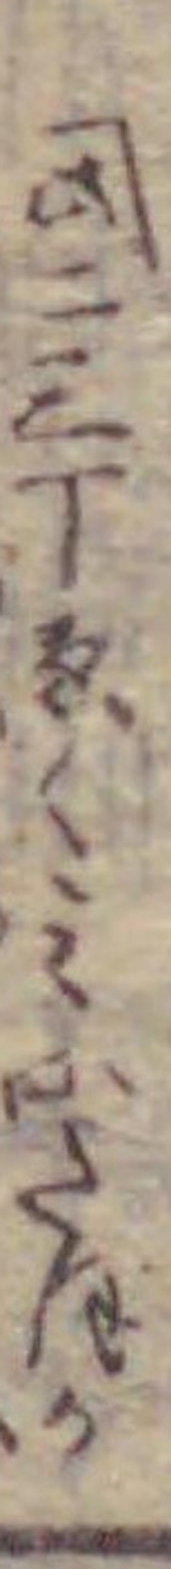〽此二三丁ゑくみにたねか
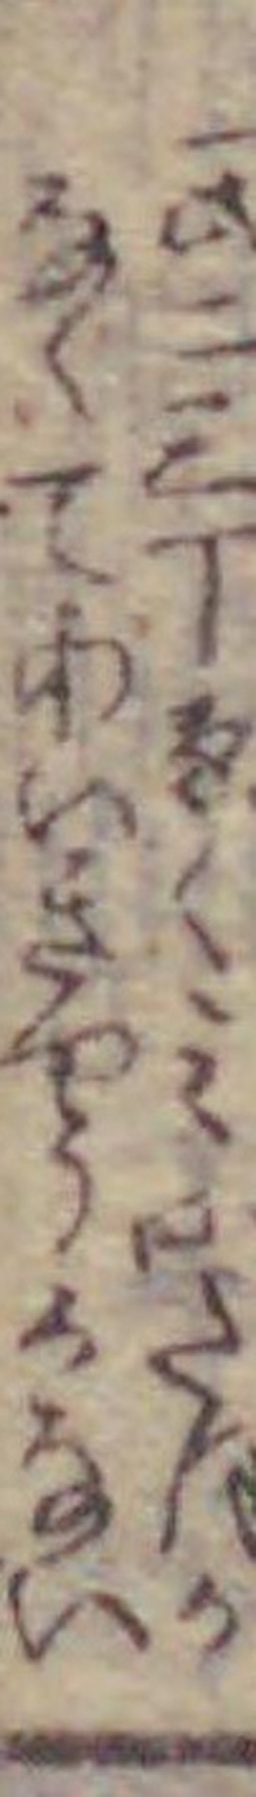なくあいきやうかない
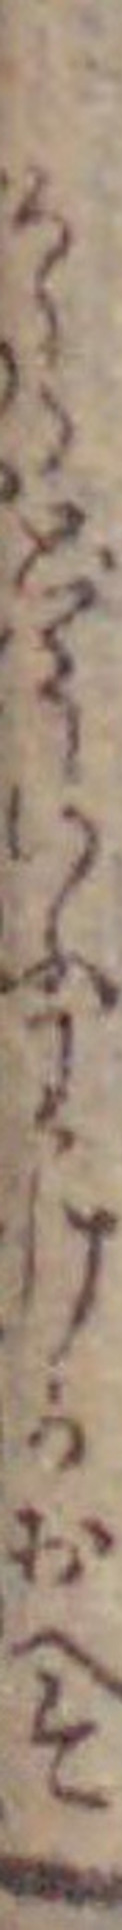からどういふわけかおへそ
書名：鼻下長生薬 : 3巻
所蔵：国立国会図書館 National Diet Library, JAPAN
